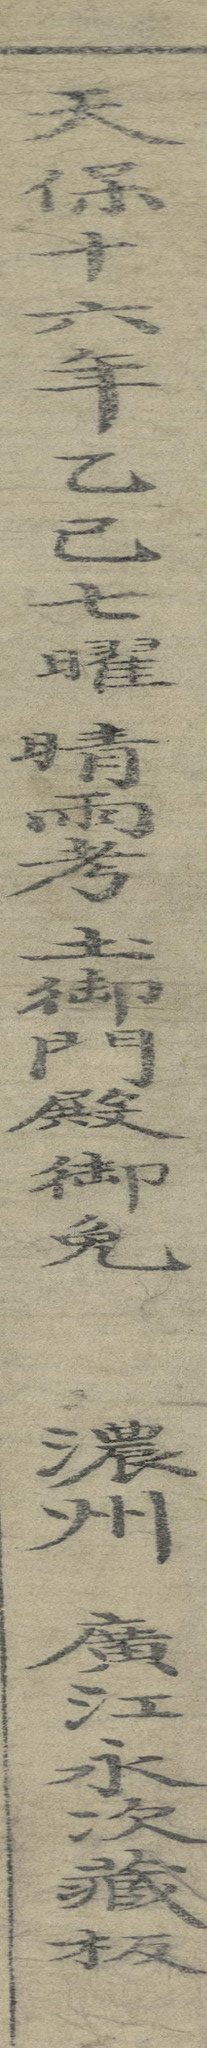天保十六年乙巳七曜晴雨考土御門殿御免濃州広江永次蔵板
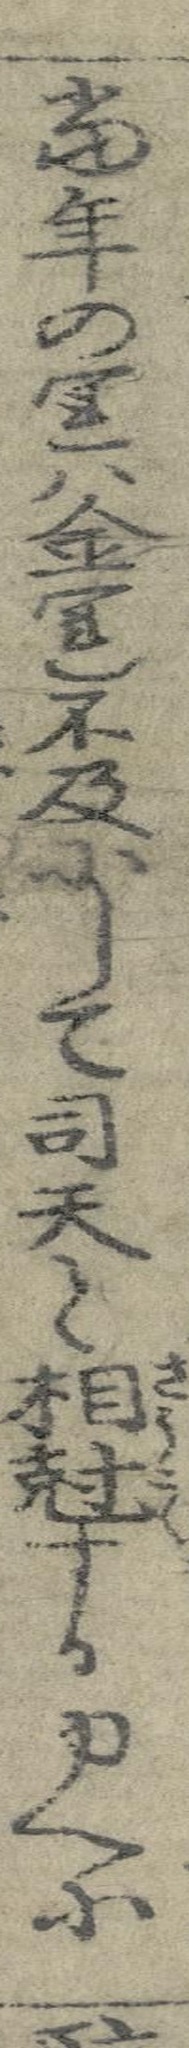当年の運は金運不及にして司天と相剋するゆへに
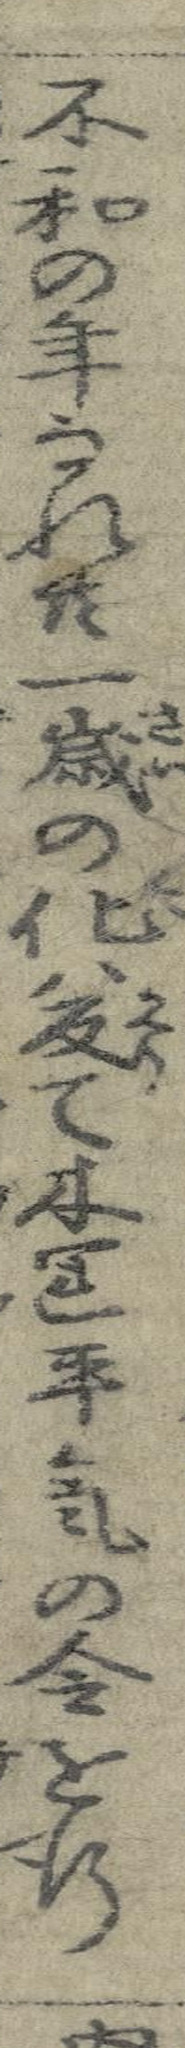不和の年なれ共一歳の化は反て木運平気の令を行
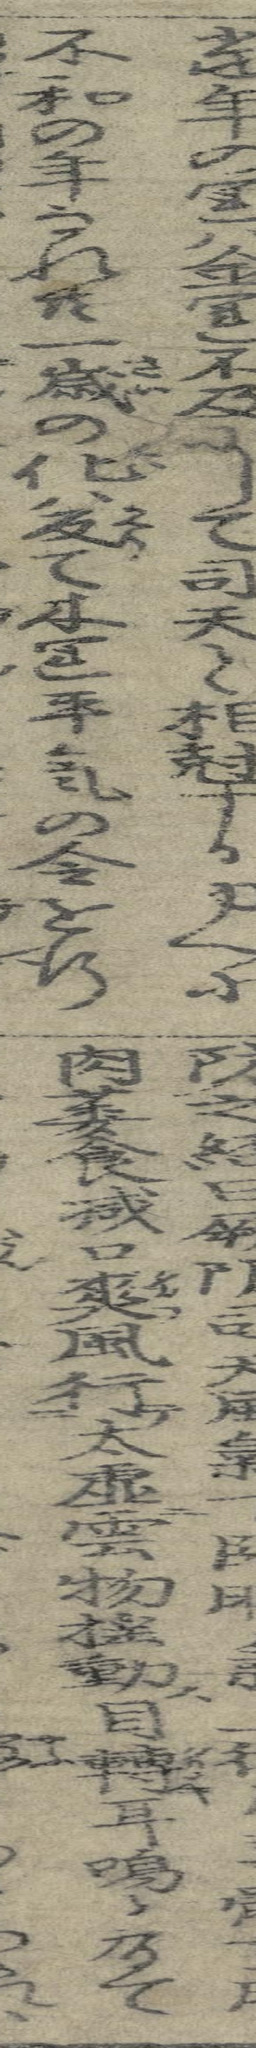不和の年なれ共一歳の化は反て木運平気の令を行
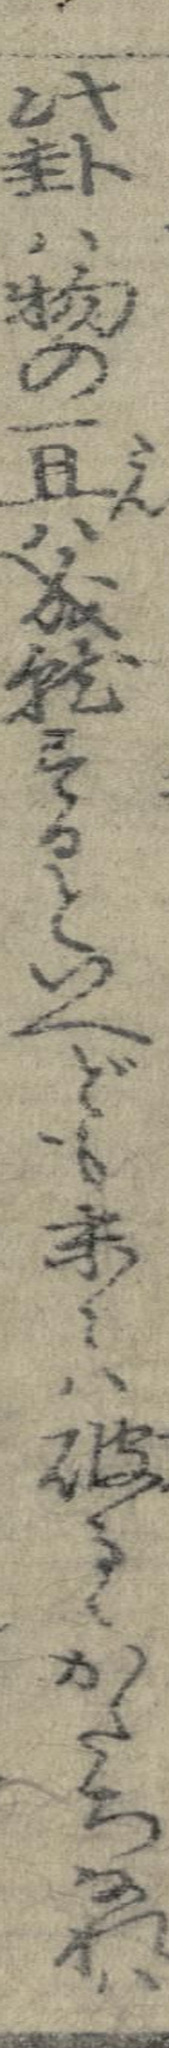此卦は物の一旦は成就するといへども末には破るゝかたちなれは
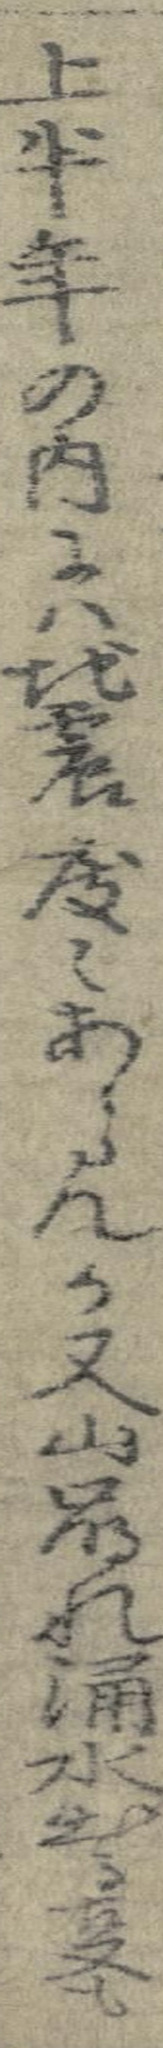上半年の内には地震度々あらんか又山崩れ湧水出る変も
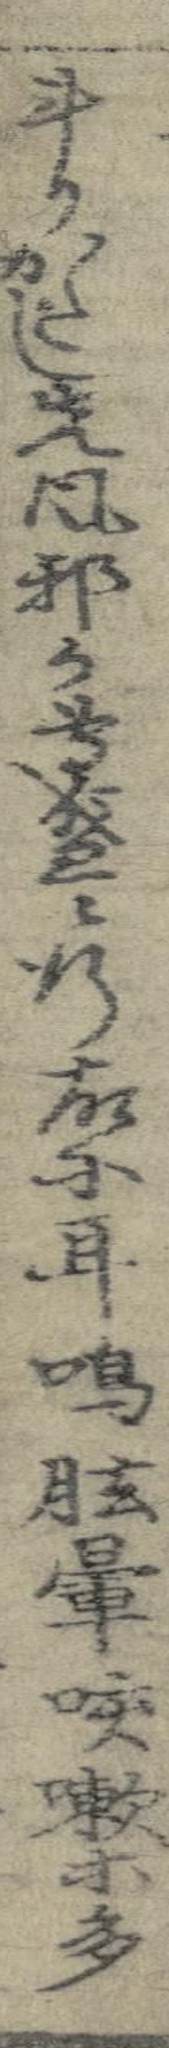計りかたし先風邪か専盛に行故に耳鳴眩暈咳嗽等多
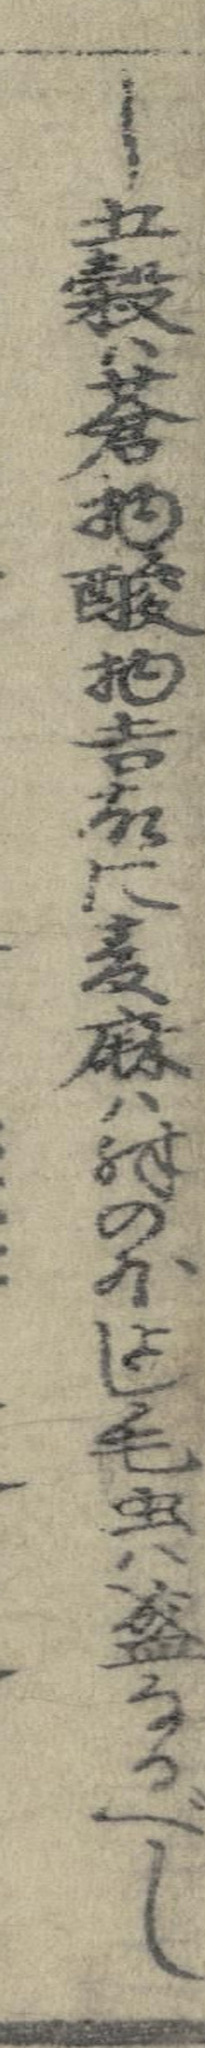し五穀は蒼物酸物吉故に麦麻は附の外よし毛虫は盛なるべし
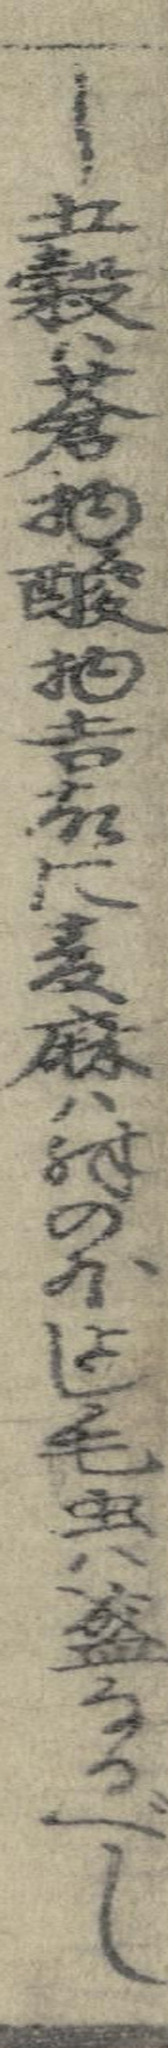し五穀は蒼物酸物吉故に麦麻は附の外よし毛虫は盛なるべし
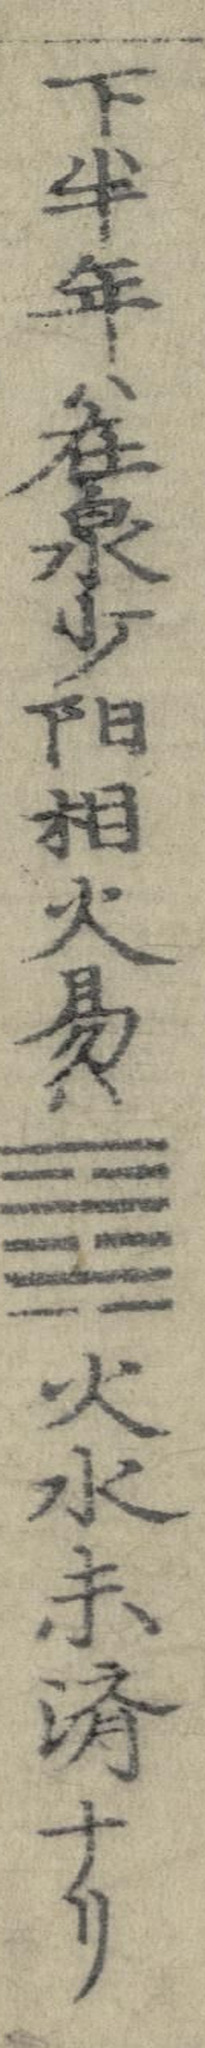下半年ハ在泉少陽相火易火水末済ナリ
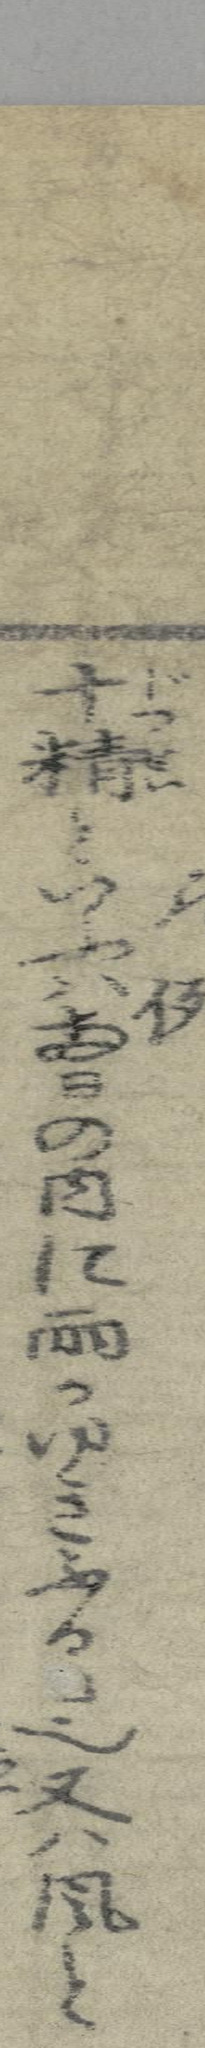十精といふは両日の内に雨かゆきふること也又は風と
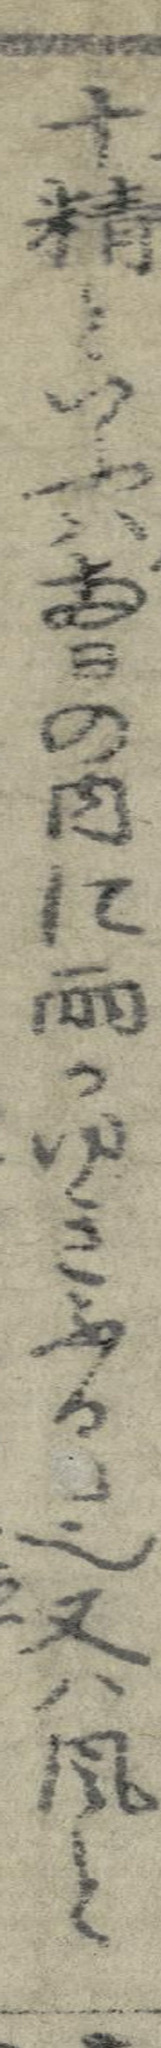十精といふは両日の内に雨かゆきふること也又は風と
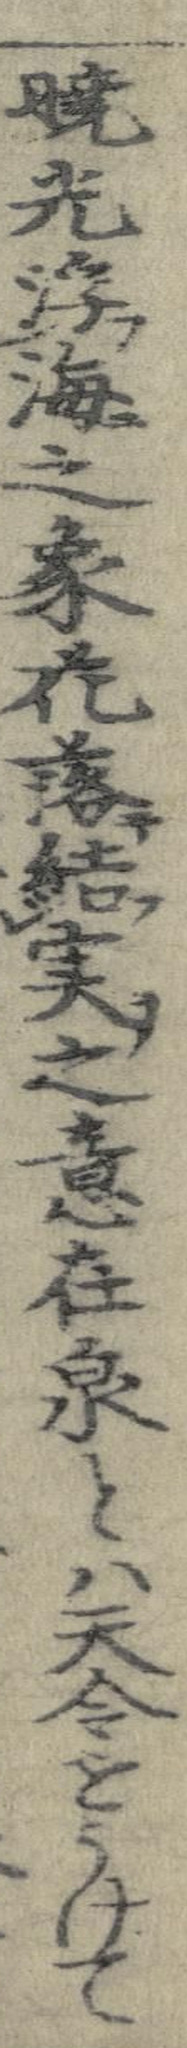暁光浮海之象花落実之意在泉とは天令をうけて
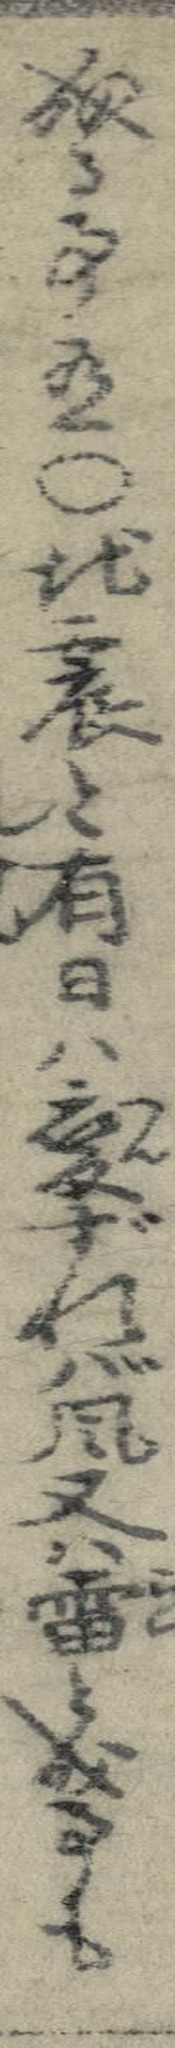成る事有〇地震と有日は変ずれば風又は雷と成るも
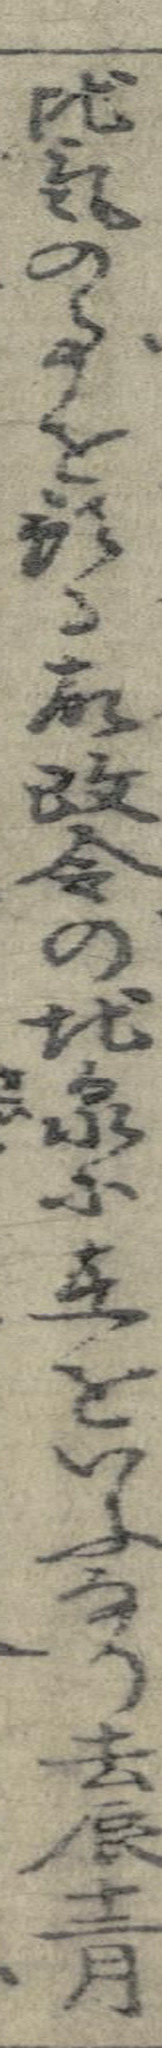此気の事を都る故政令の地泉に在をいふなり去辰十二月
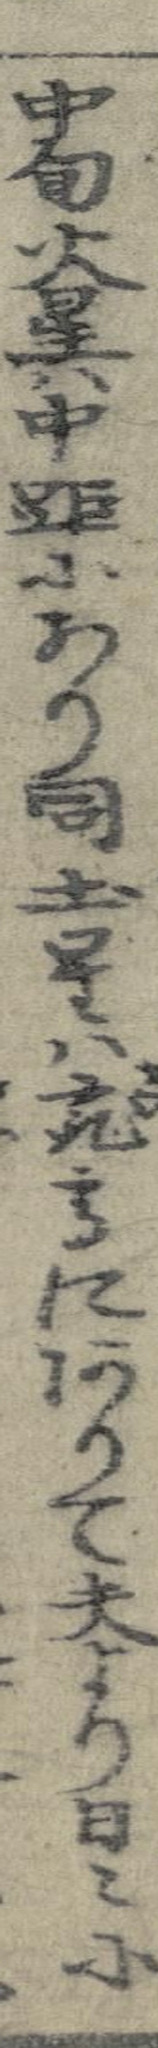中旬火星は中距にあり同土星は最高にありて夫より日々に
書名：天保十六年乙巳七曜　晴雨考　土御門殿御免
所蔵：東京大学地震研究所図書室 Earthquake Research Institute Library, The University of Tokyo, JAPAN
